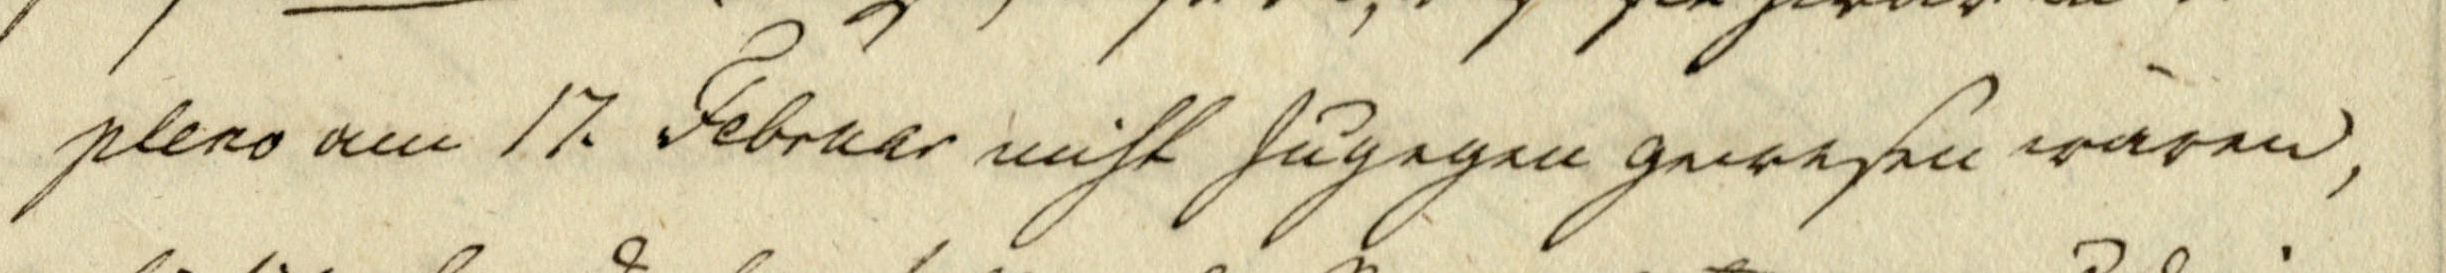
pleno am 17. Februar nicht zugegen gewesen wären,
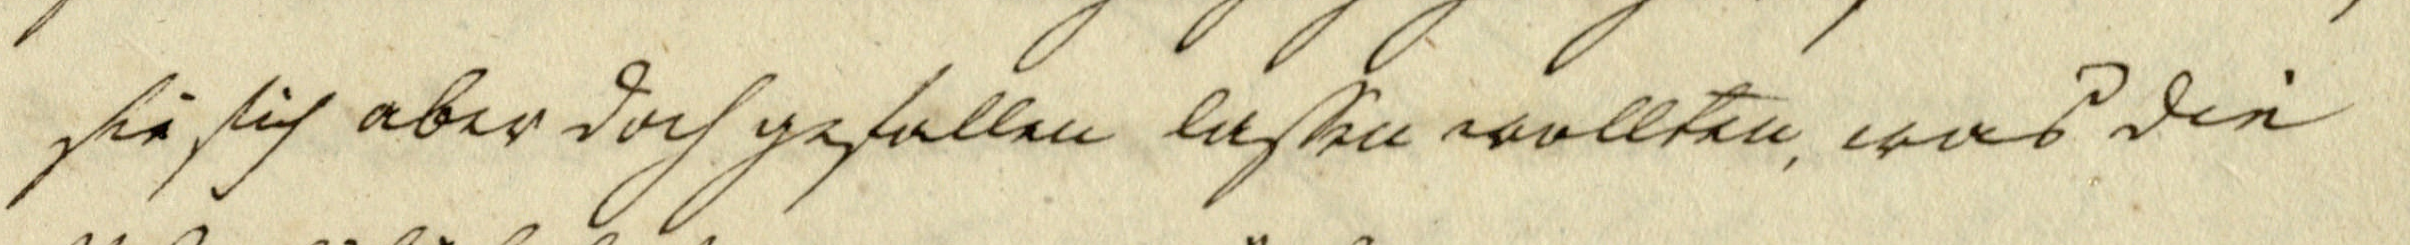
sie sich aber doch gefallen lassen wollten, was die
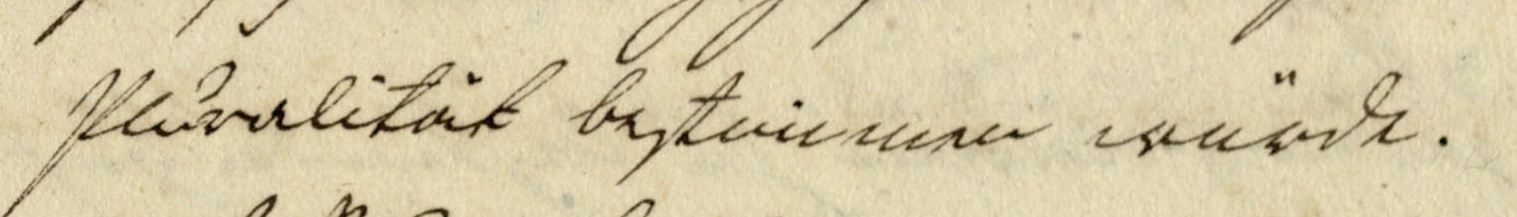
Pluralität bestimmen würde.
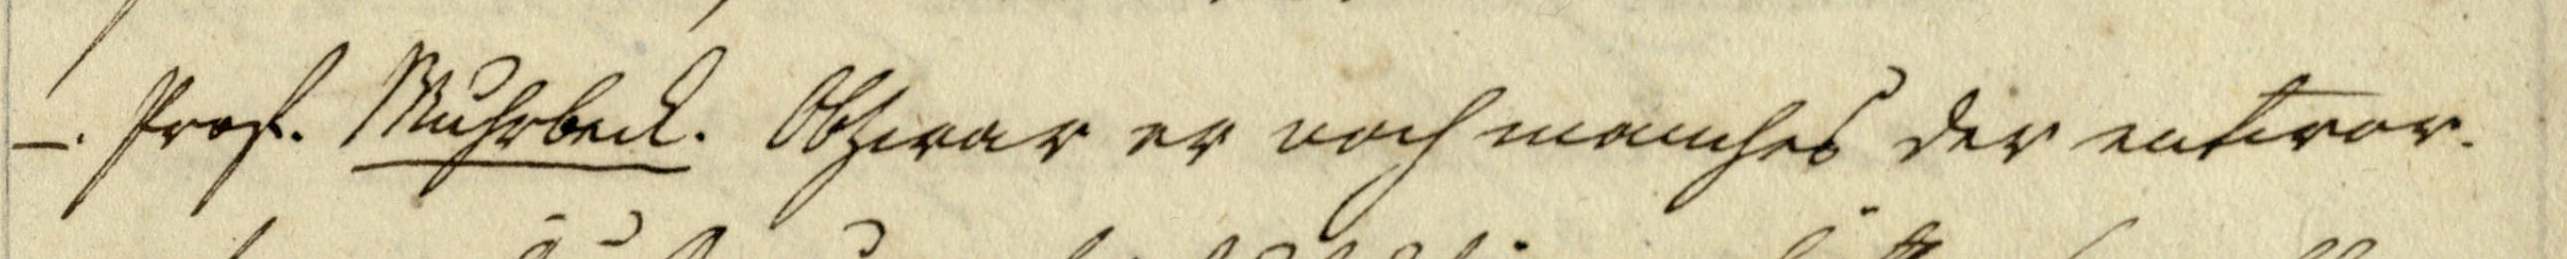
Prof. Muhrbeck. Obzwar er noch manches der entwor¬
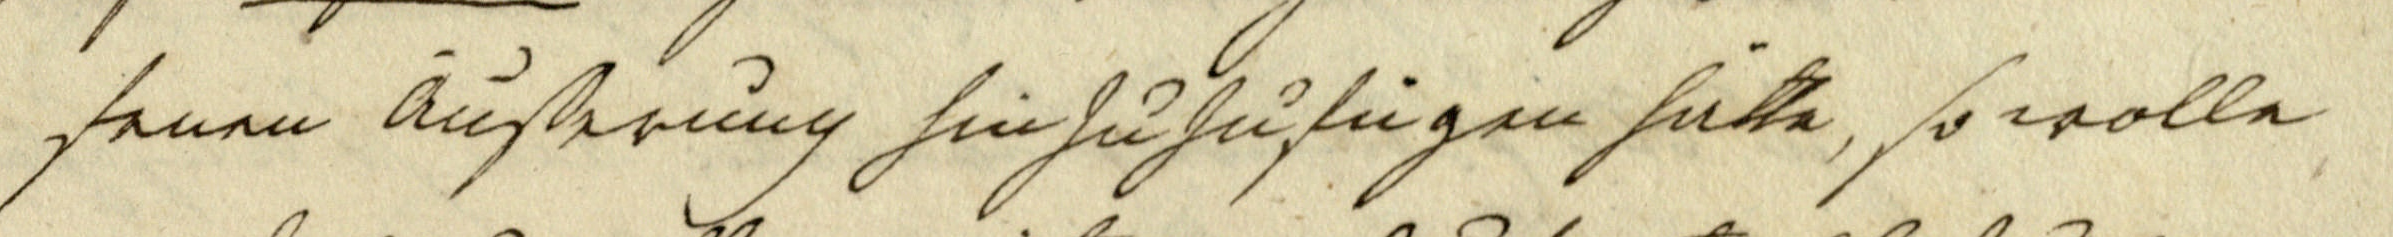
fenen Äusserung hinzuzufügen hätte, so wolle
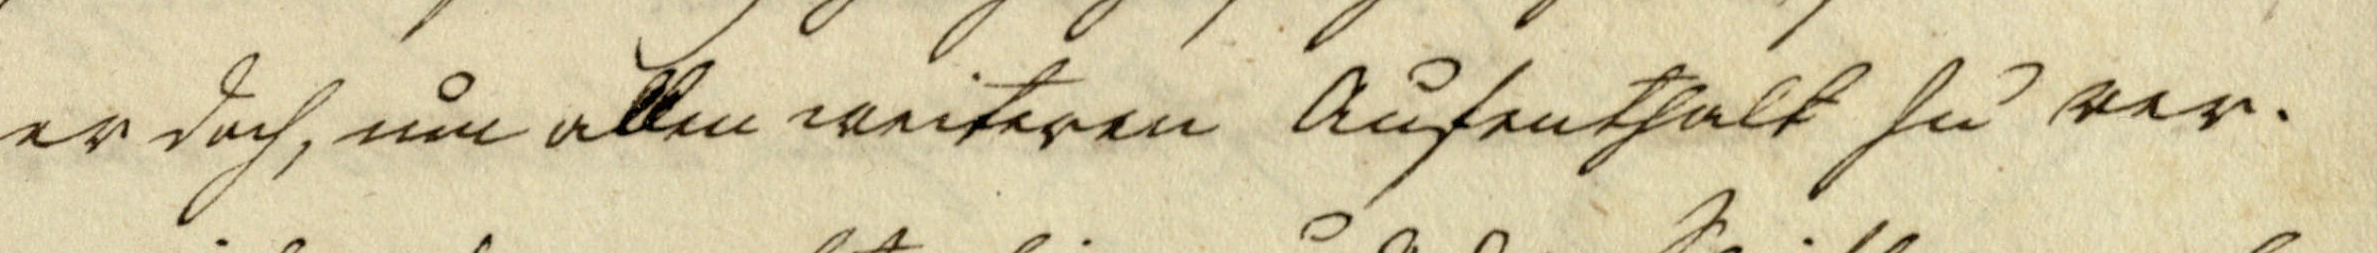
er doch, um allen weiteren Aufenthalt zu ver¬
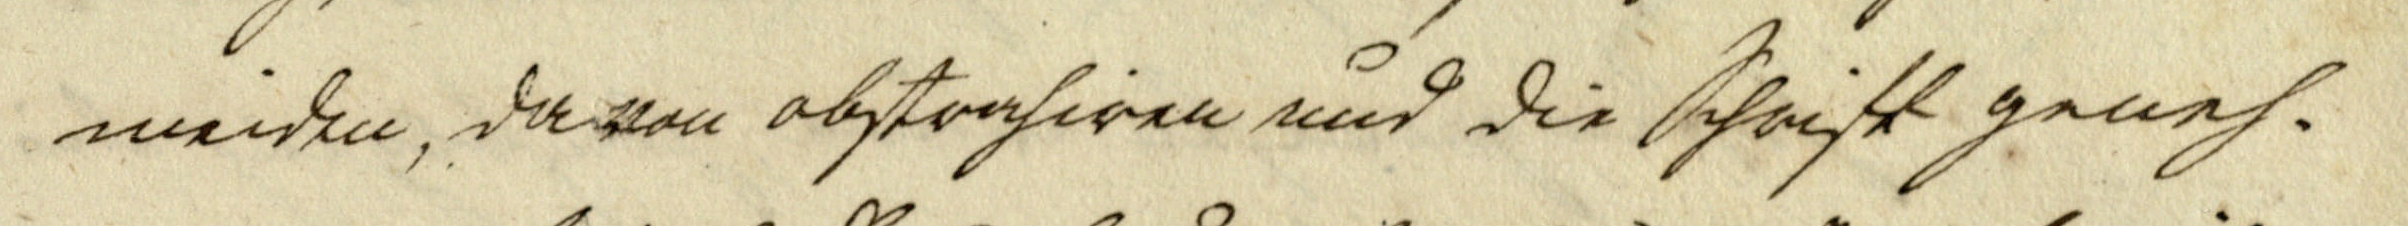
meiden, davon abstrahiren und die Schrift geneh¬
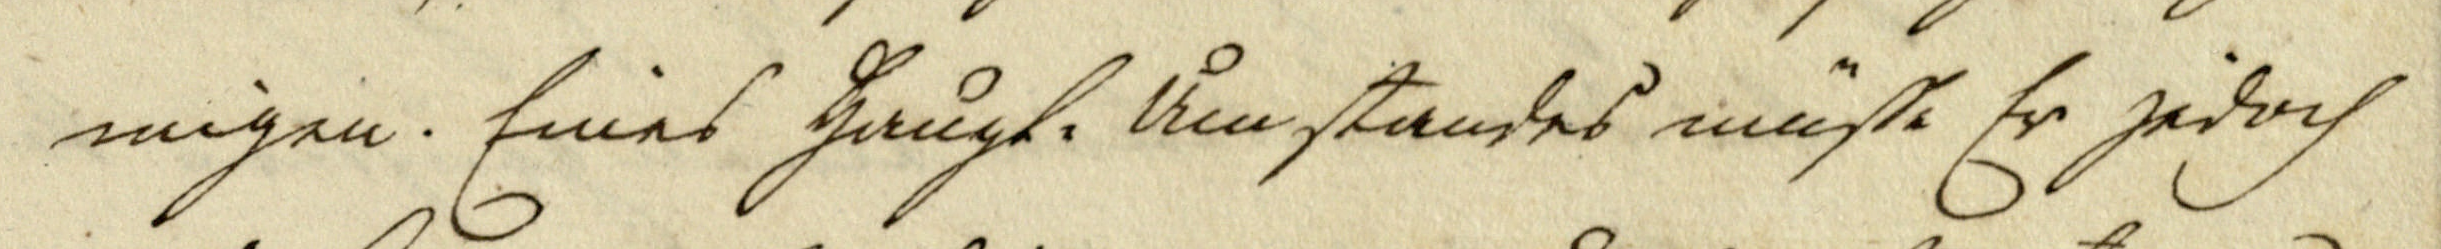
einigen. Eines Haupt- Umstandes müsse Er jedoch
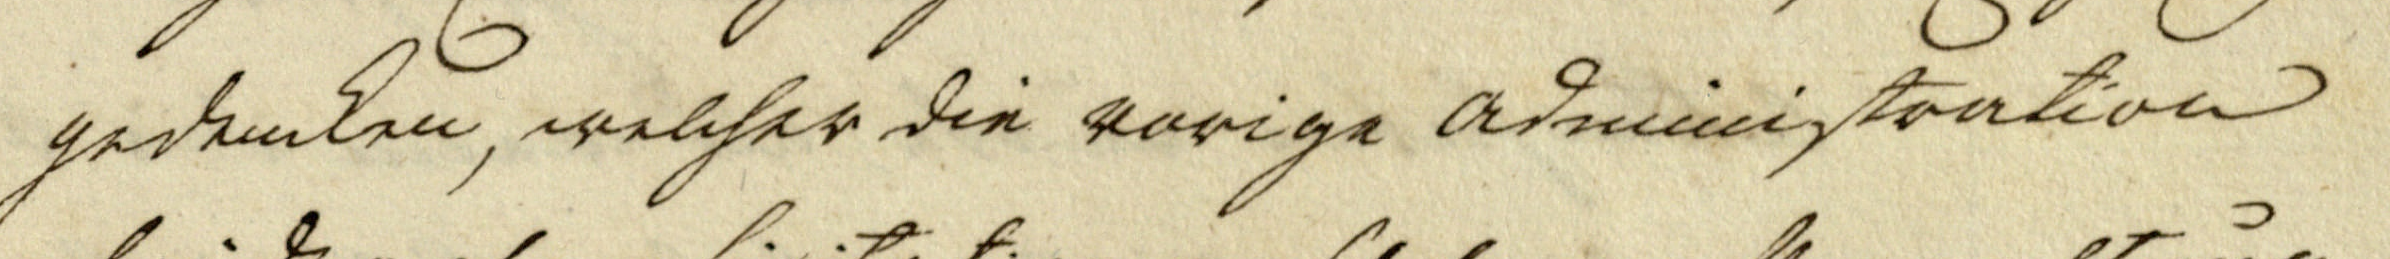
gedencken, welcher die vorigen Administration
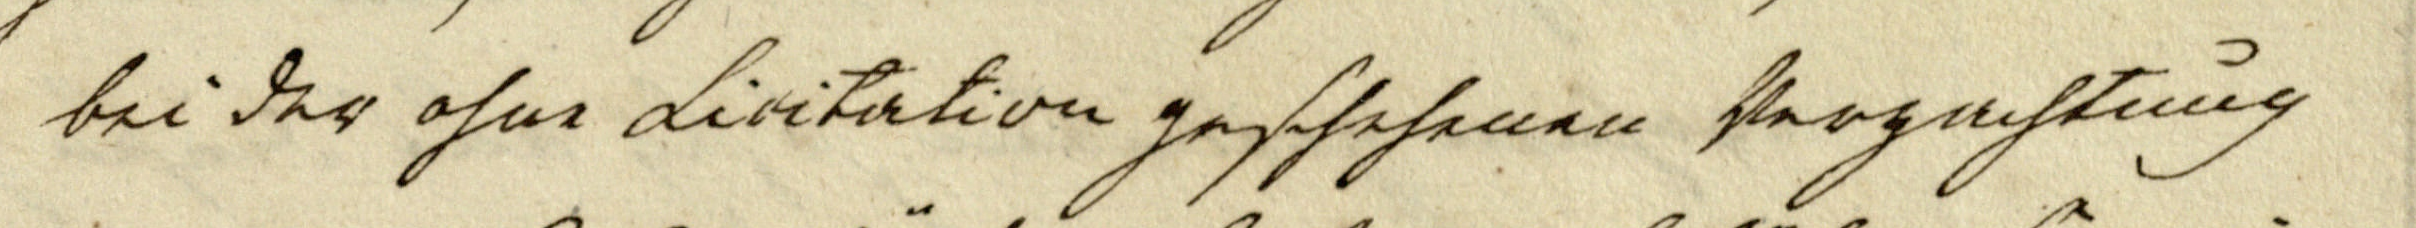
bei der ohne Licitation geschehenen Verpachtung
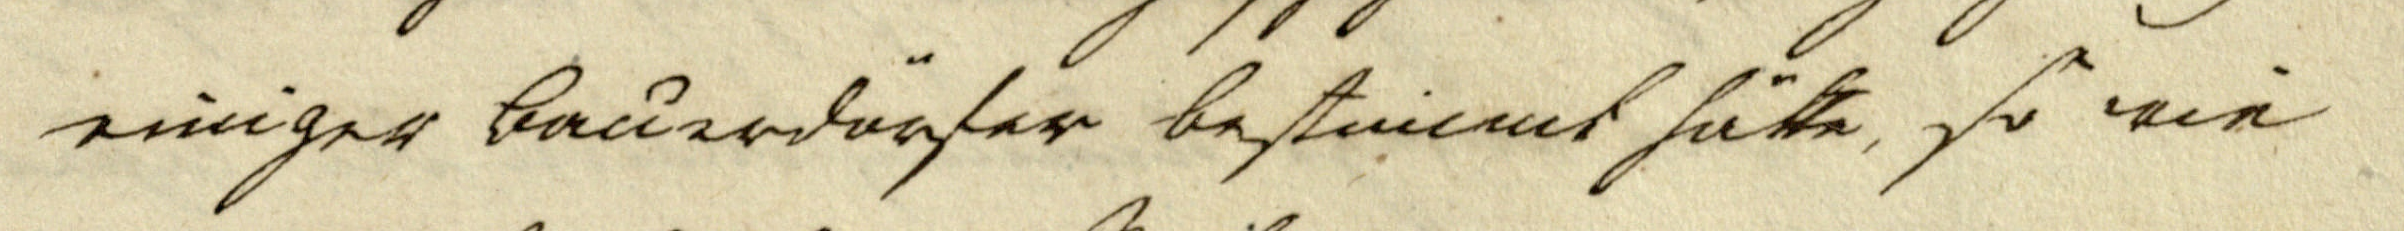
einiger Bauerdörfer bestimmt hätte, so wie
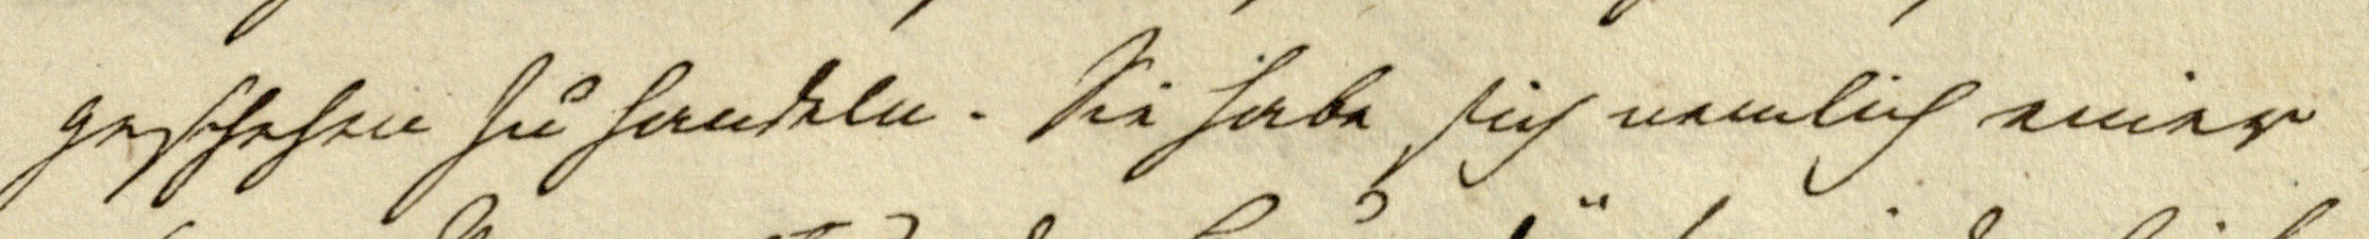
geschehen zu handeln. Sie habe sich nemlich einer
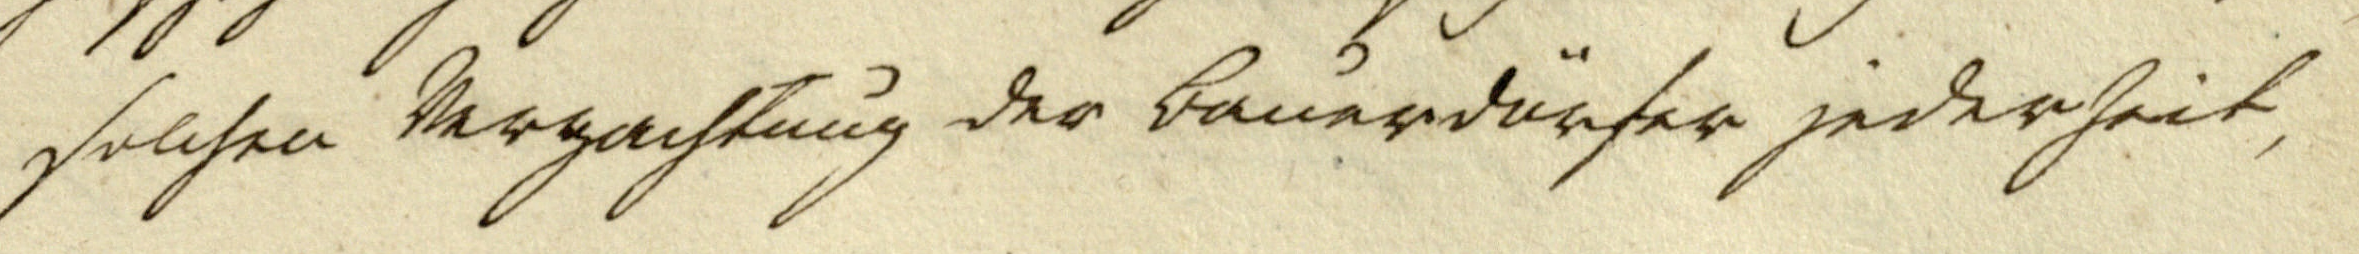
solchen Verpachtung der Bauerdörfer jederzeit,
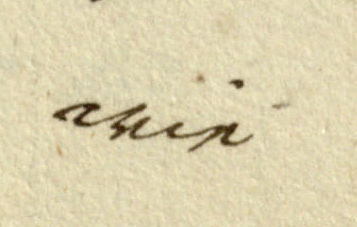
wie
